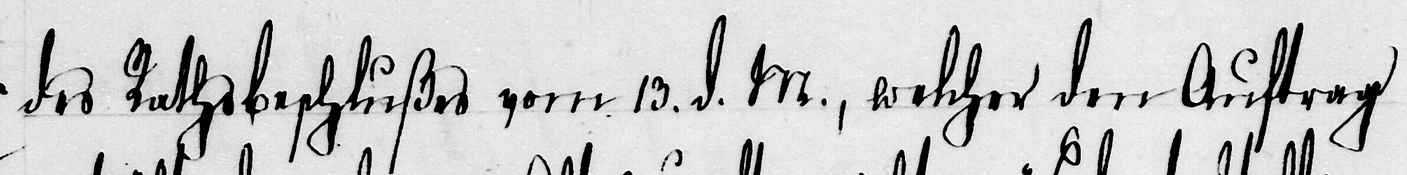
des Rathsbeschlußes vom 13. d. M., welcher den Auftrag
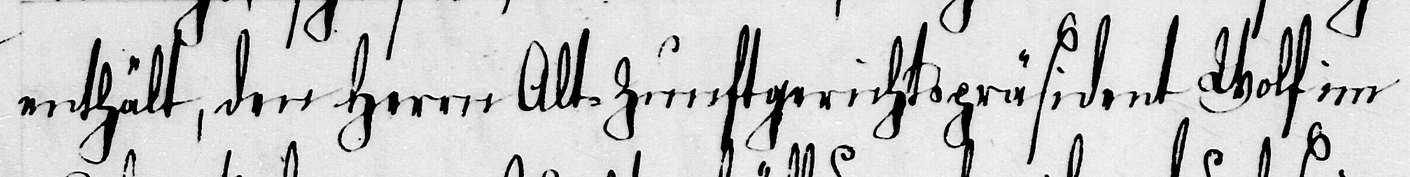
enthält, den Herrn Alt-Zunftgerichtspräsident Wolf im
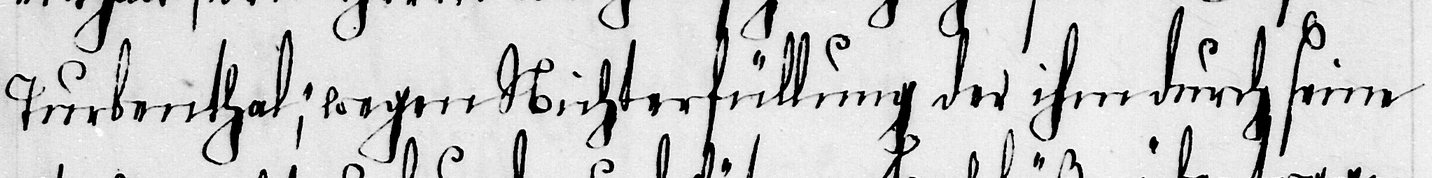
Turbenthal, „wegen Nichterfüllung der ihm durch seine
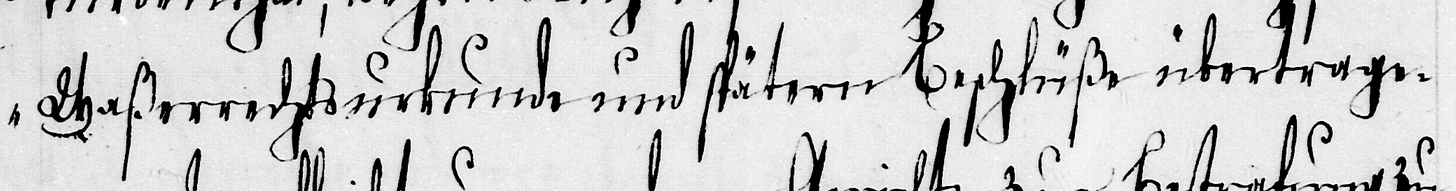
Waßerrechtsurkunde und spätern Beschlüße übertrage¬
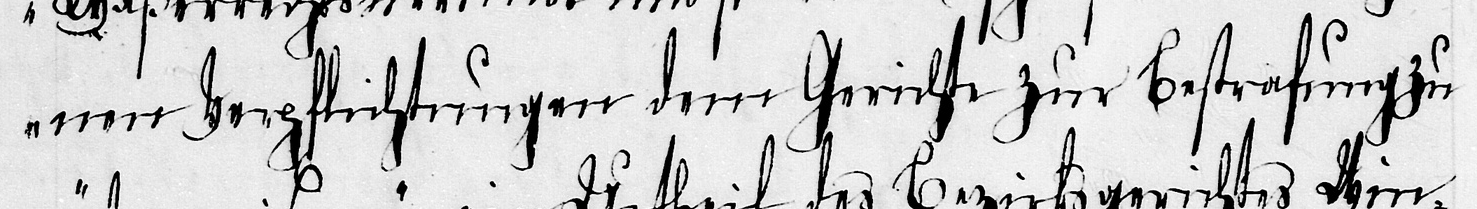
nen Verpflichtungen dem Gerichte zur Bestrafung zu
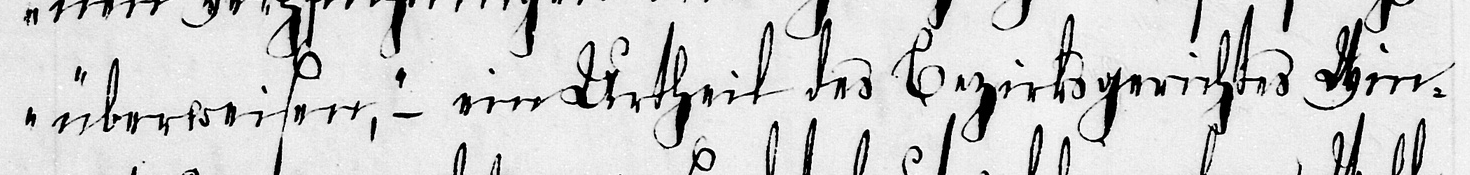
überweisen,“ – ein Urtheil des Bezirksgerichtes Win¬
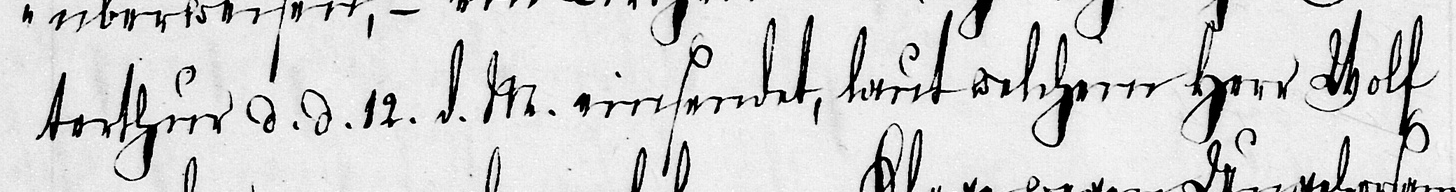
terthur d. d. 12. d. M. einsendet, laut welchem Herr Wolf
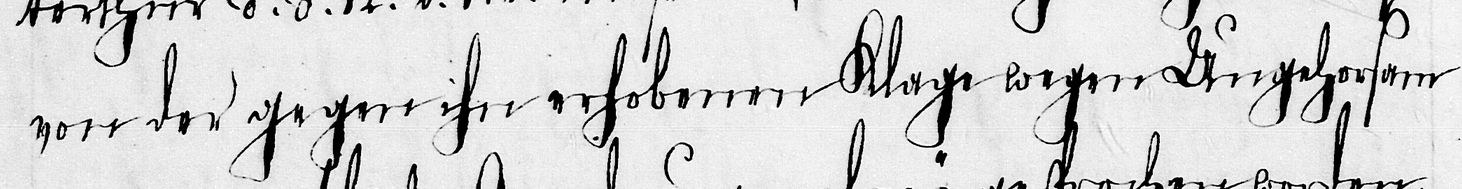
von der gegen ihn erhobenen Klage wegen Ungehorsam
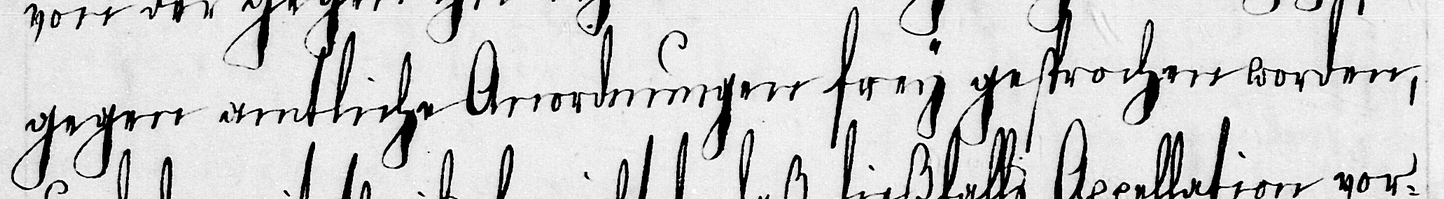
gegen amtliche Anordnungen frey gesprochen worden,
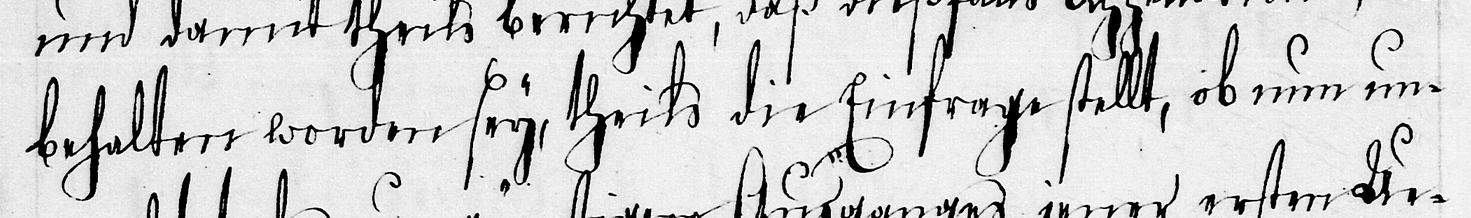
behalten worden sey, theils die Einfrage stellt, ob nun un¬
